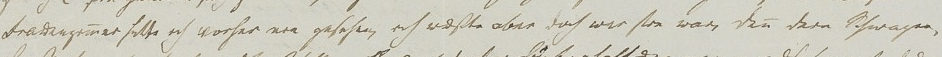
Frauenzimmer hatte ich vorher nie gesehen, ich wußte aber doch wer sie war, denn dein Schwager,
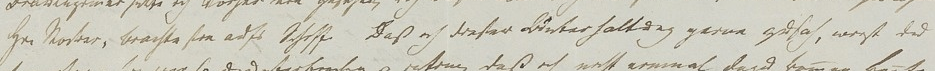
Hr. Stockar, brachte sie aufs Schiff. Daß ich dieser Unterhaltung gerne zusah, wirst Du
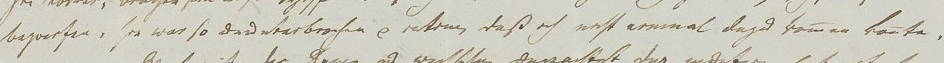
begreifen. Sie war so ununterbrochen & intim, daß ich nicht einmal dazu kommen konnte,
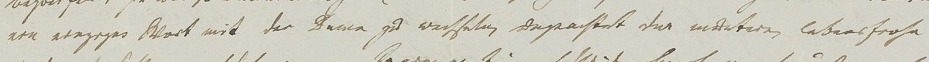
ein einziges Wort mit der Dame zu wechseln, ungeachtet das muntere, lebensfrohe
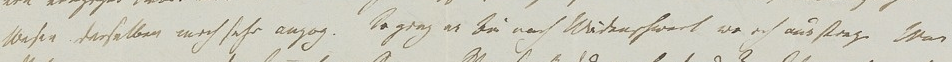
Wesen derselben mich sehr anzog. So ging es bis nach Wädenschweil wo ich ausstieg. Was
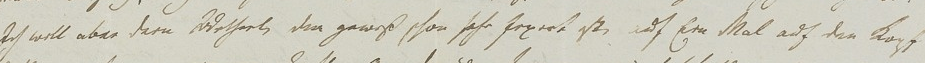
Ich will aber dein Urtheil, das gewiß schon sehr fixirt ist, auf Ein Mal auf den Kopf
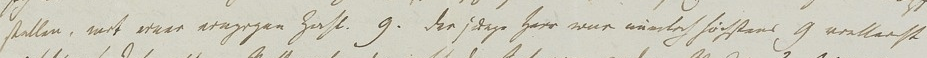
stellen, mit einer einzigen Zahl. 9. Der junge Herr war wirklich höchstens 9 vielleicht
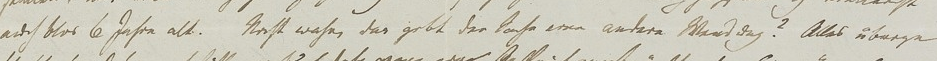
auch blos 6 Jahre alt. Nicht wahr, das gibt der Sache eine andere Wendung? Alles übrige
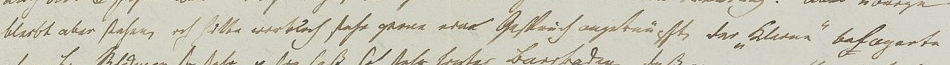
bleibt aber stehen, ich hätte wirklich sehr gerne ein Gespräch angeknüpft, der «Kleine» belagerte
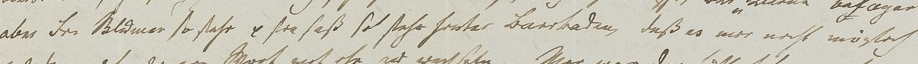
aber Fr. Blumer so sehr & sie saß so sehr hinter Barikaden, daß es mir nicht möglich
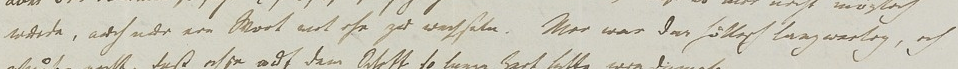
wurde, auch nur ein Wort mit ihr zu wechseln. Wie war das höllisch langweilig, ich
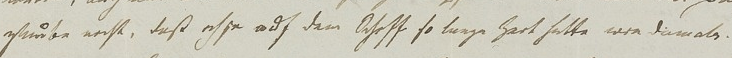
glaube nicht, daß ich je auf dem Schiff so lange Zeit hatte wie damals.
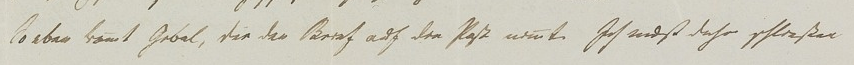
So eben kommt Gebel, der den Brief auf die Post nimmt. Ich muß daher schließen
